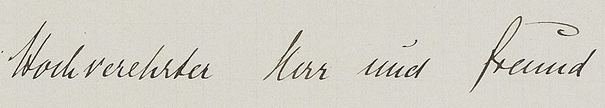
Hochverehrter Herr und Freund
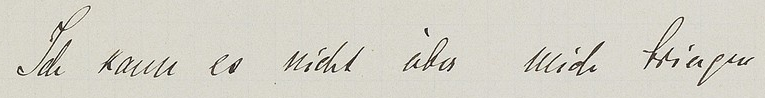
Ich kann es nicht über mich bringen
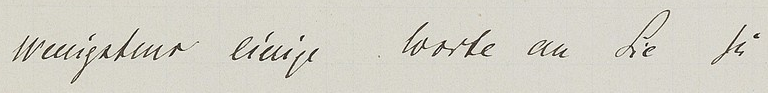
wenigstens einige Worte an Sie zu
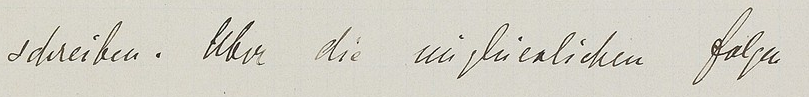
schreiben. Über die unglücklichen Folgen
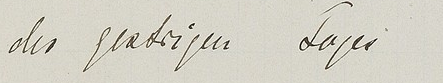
des gestrigen Tages
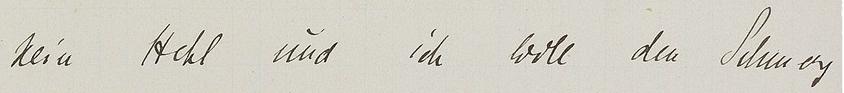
kein Hehl und ich will den Schmerz
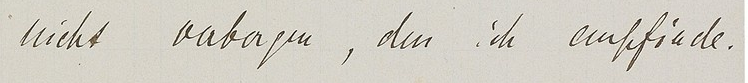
nicht verbergen, den ich empfinde.
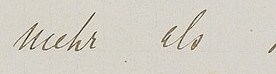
mehr als
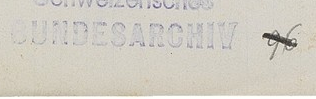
heute habe ich
